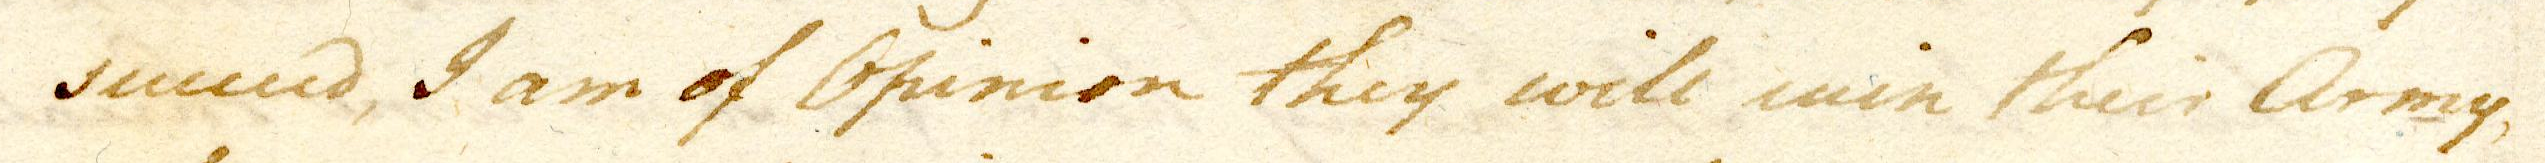succeed, I am of Opinion they will win their Army,
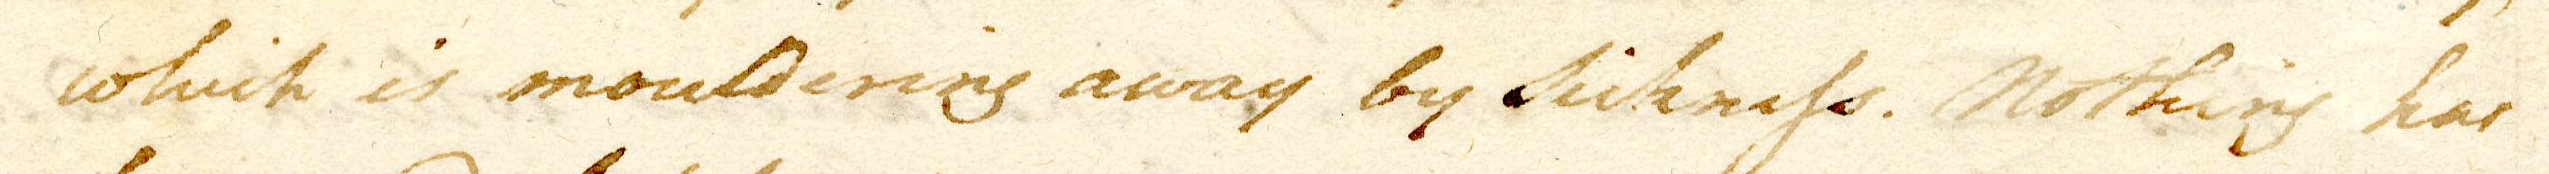which is mouldering away by Sickness. Nothing has
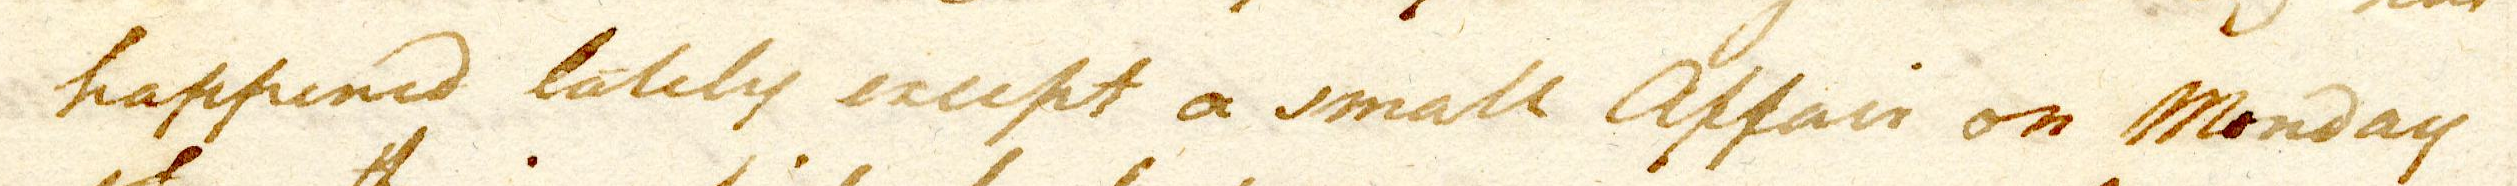happened lately except a small Affair on Monday
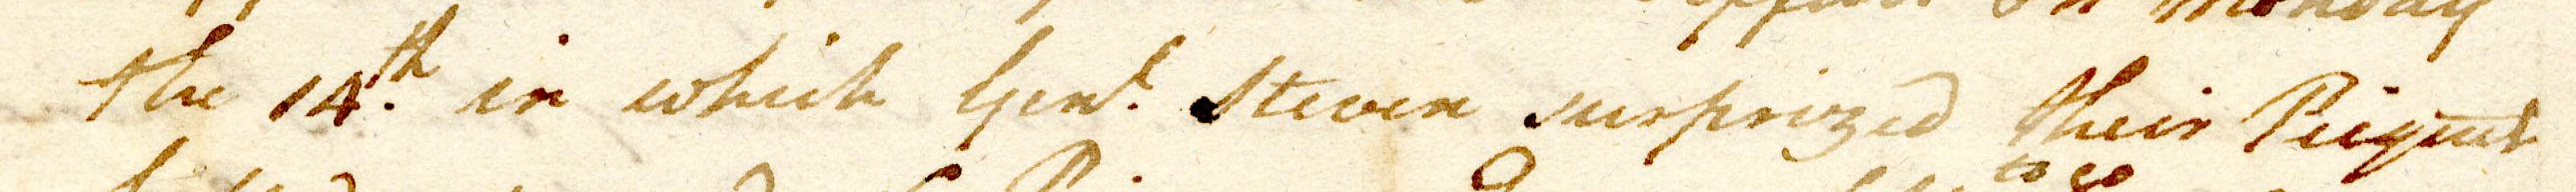the 14^th. in which Gen^l. Steven surprized their Piquet
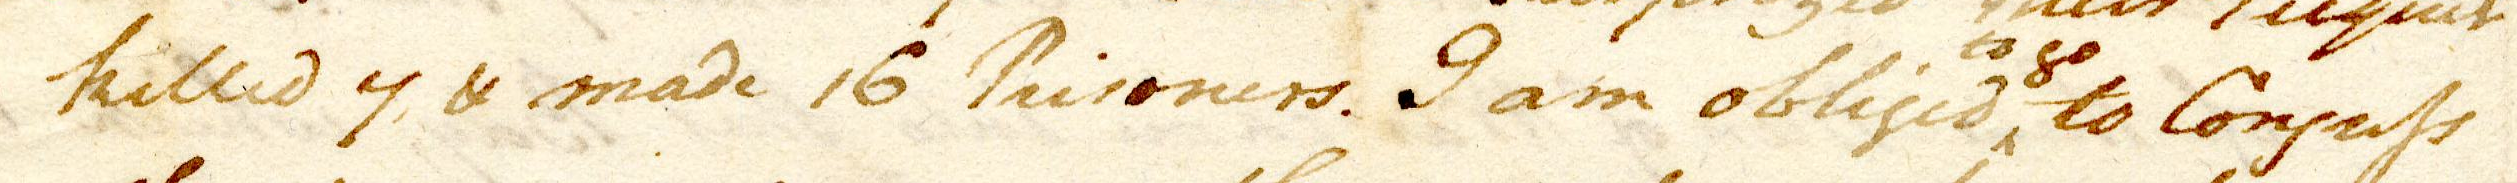killed 7, & made 16 Prisoners. I am obliged ^to go to Congress
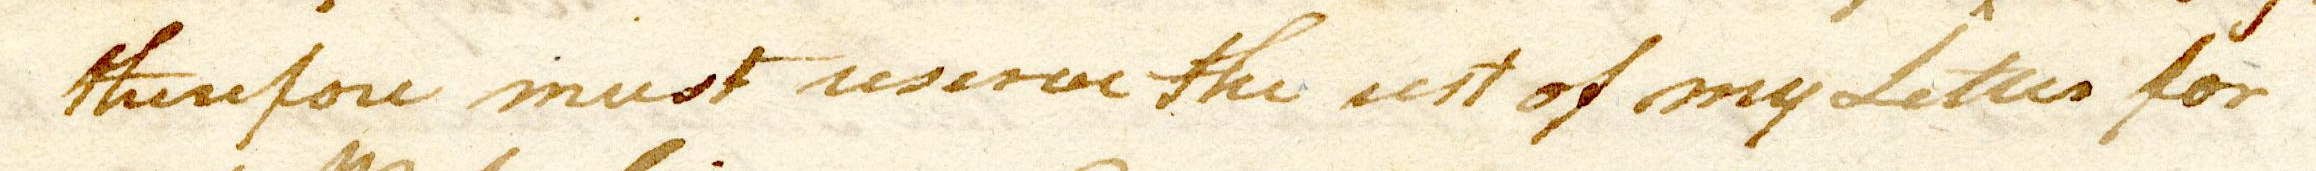therefore must reserve the rest of my Letter for
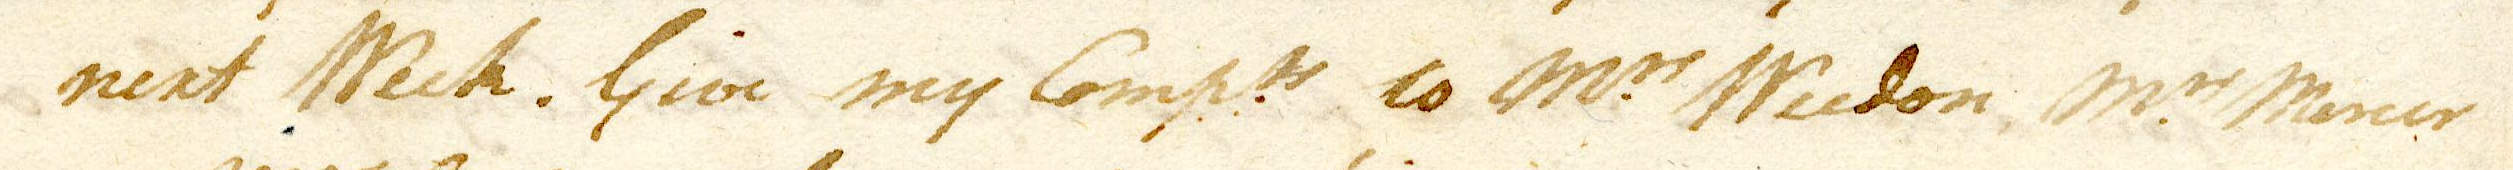next Week. Give my Comp^ts. to M^rs. Weedon, M^rs. Mercer
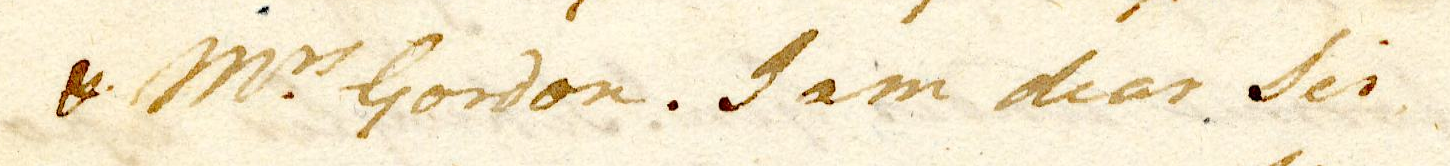& M^rs. Gordon. I am dear Sir,
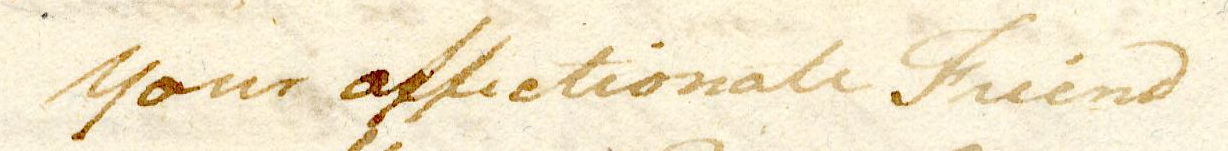your affectionate Friend
